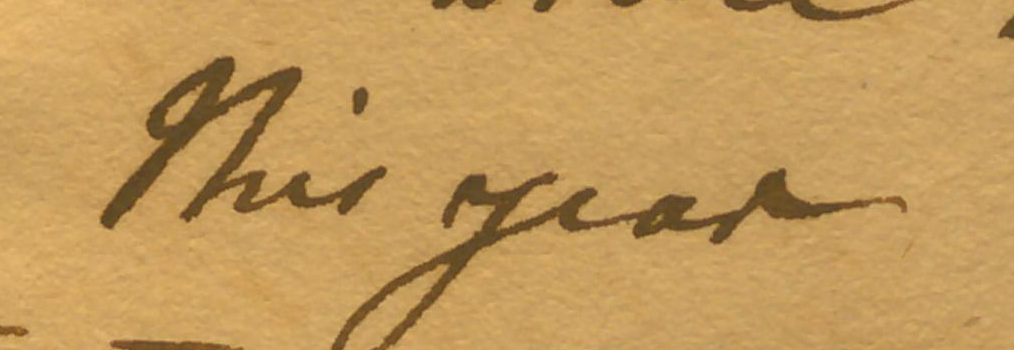this year
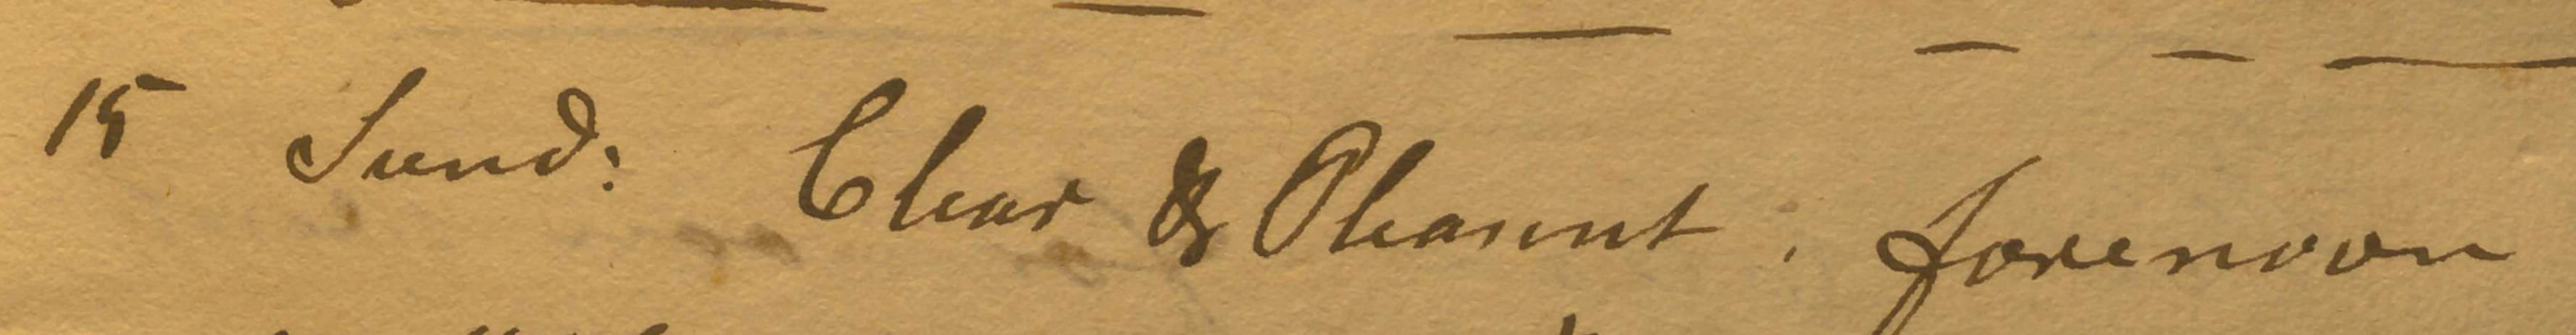15 Sund. Clear & Pleasent. forenoon
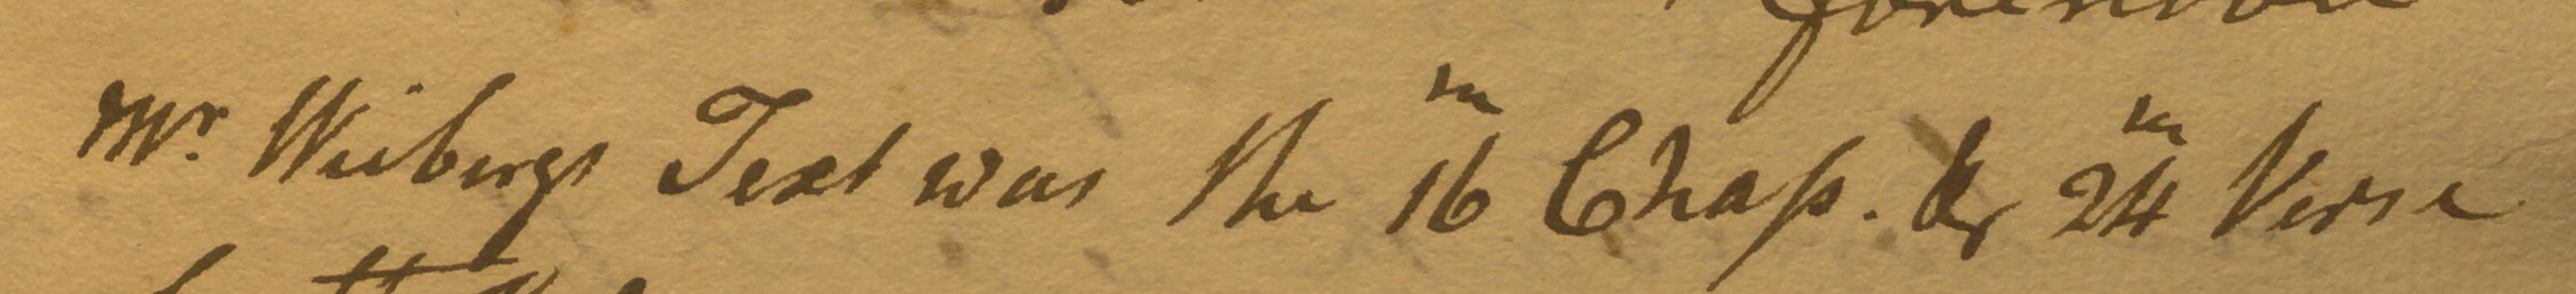M^r. Weibergs Text was the 16^th Chap. & 24^th Verse
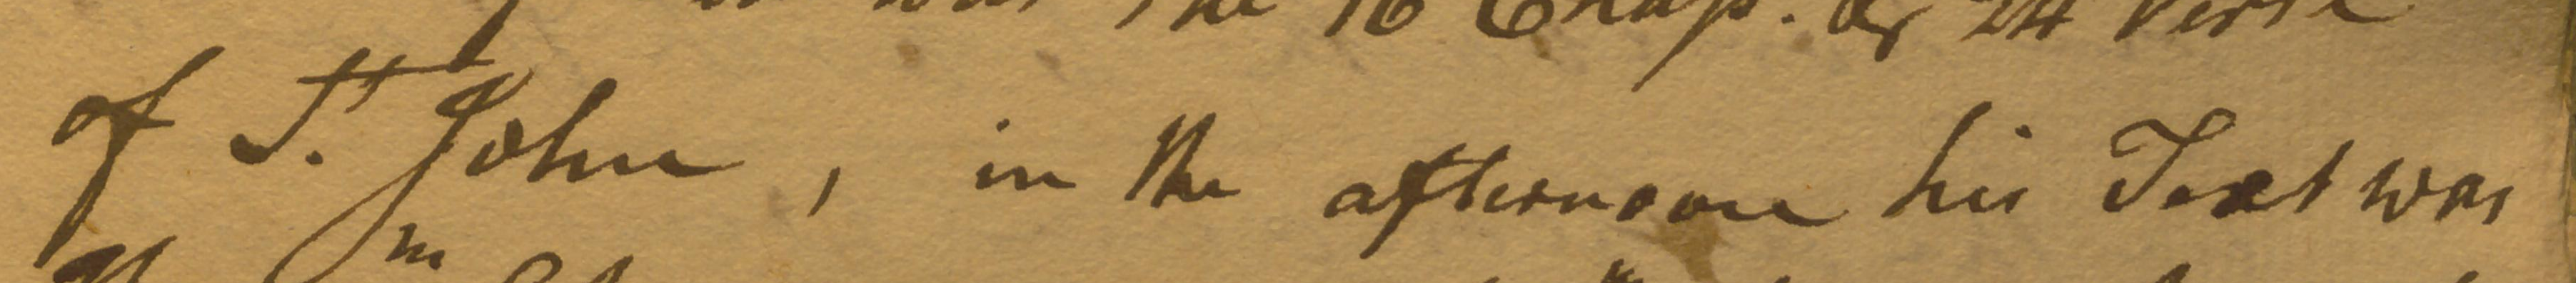of S^t. John, in the afternoon his Text was
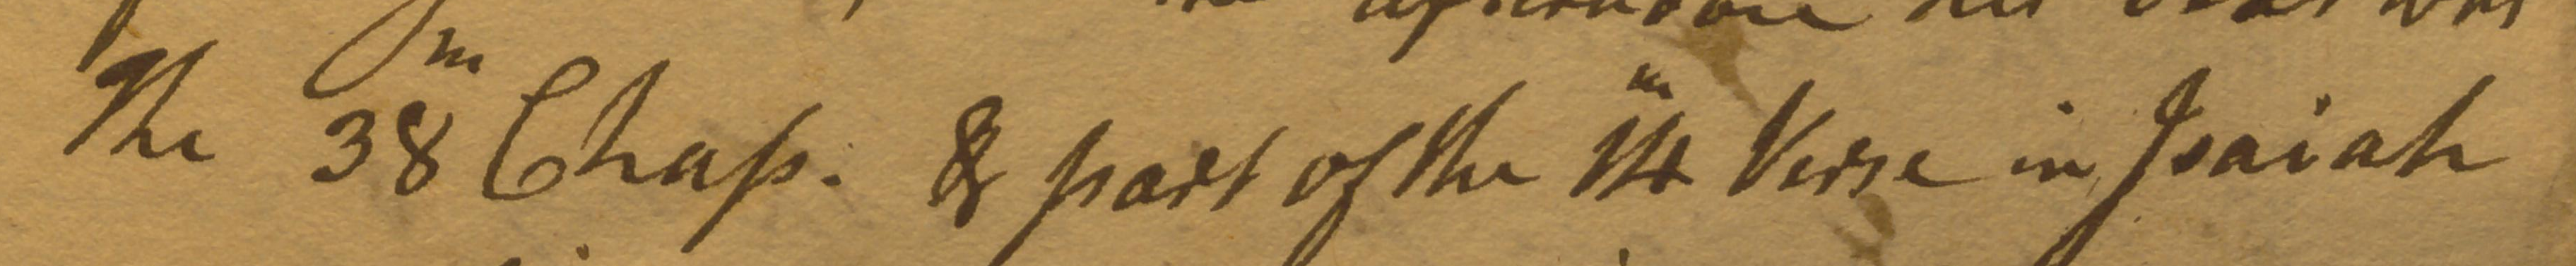the 38^th Chap. & part of the 14^th Verse in Isaiah
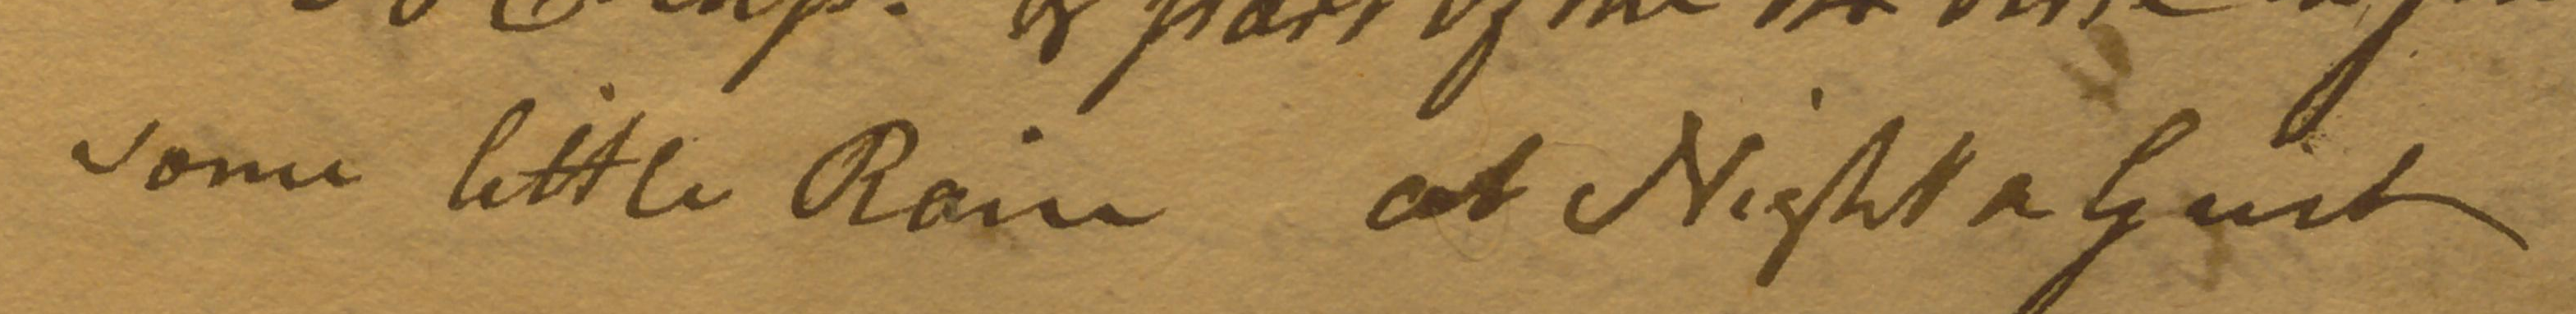some little Rain at Night a Gust
